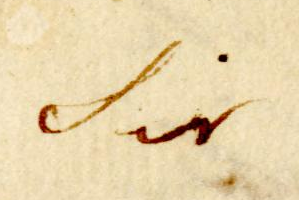Sir
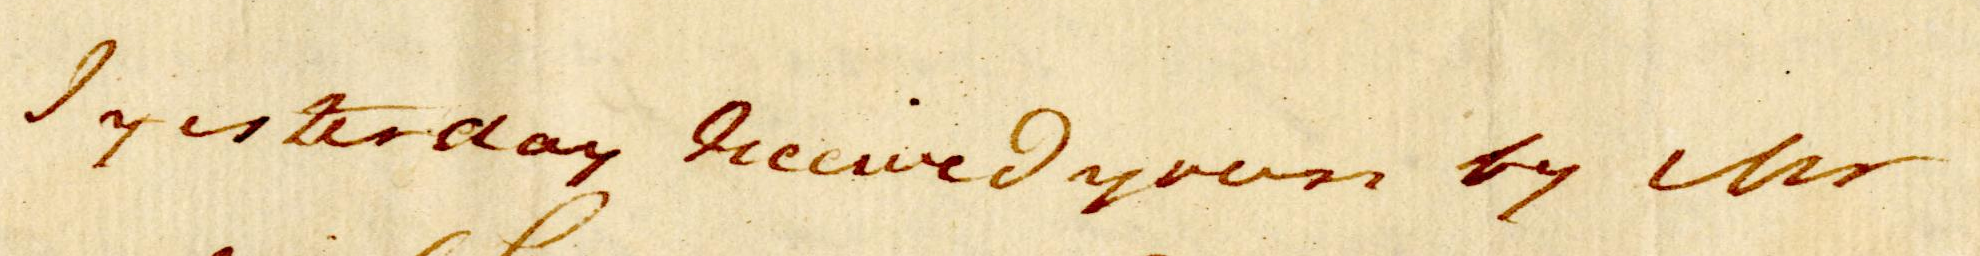I yesterday received yours by M^r
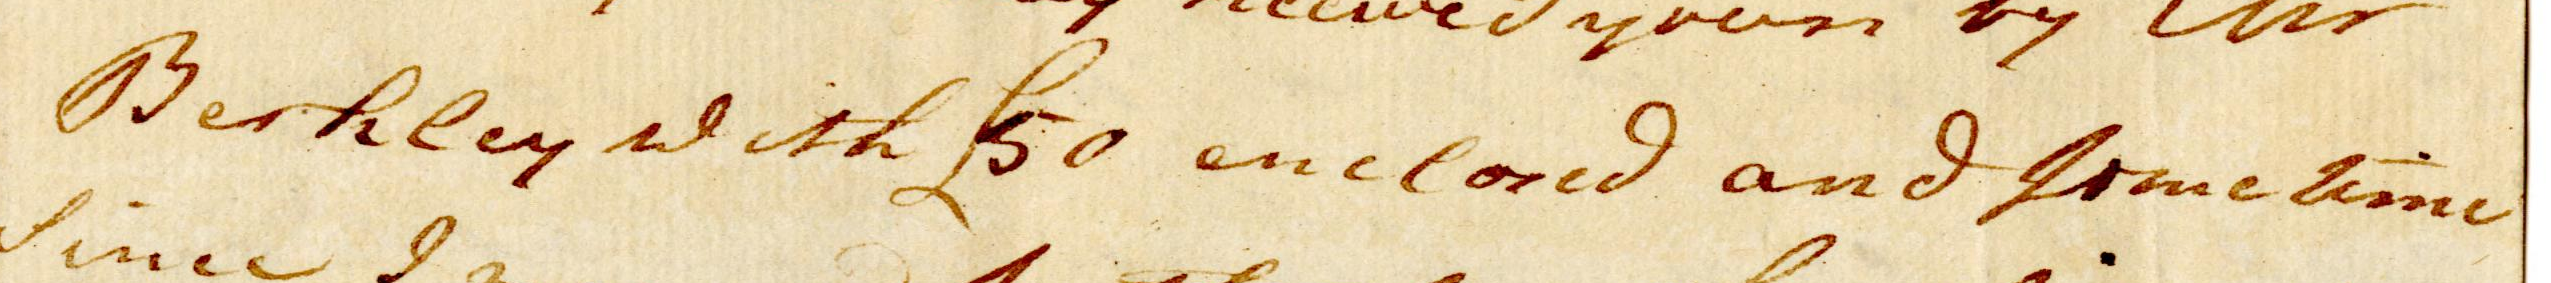Berkley with £50 enclosd and some time
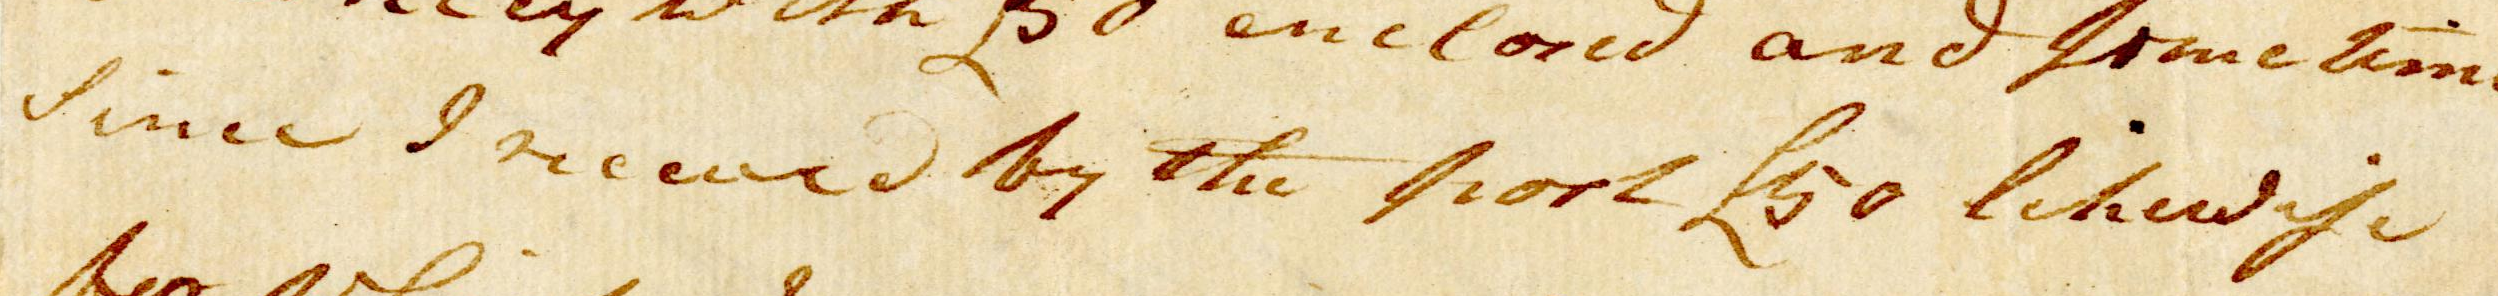since I received by the post £50 likewise
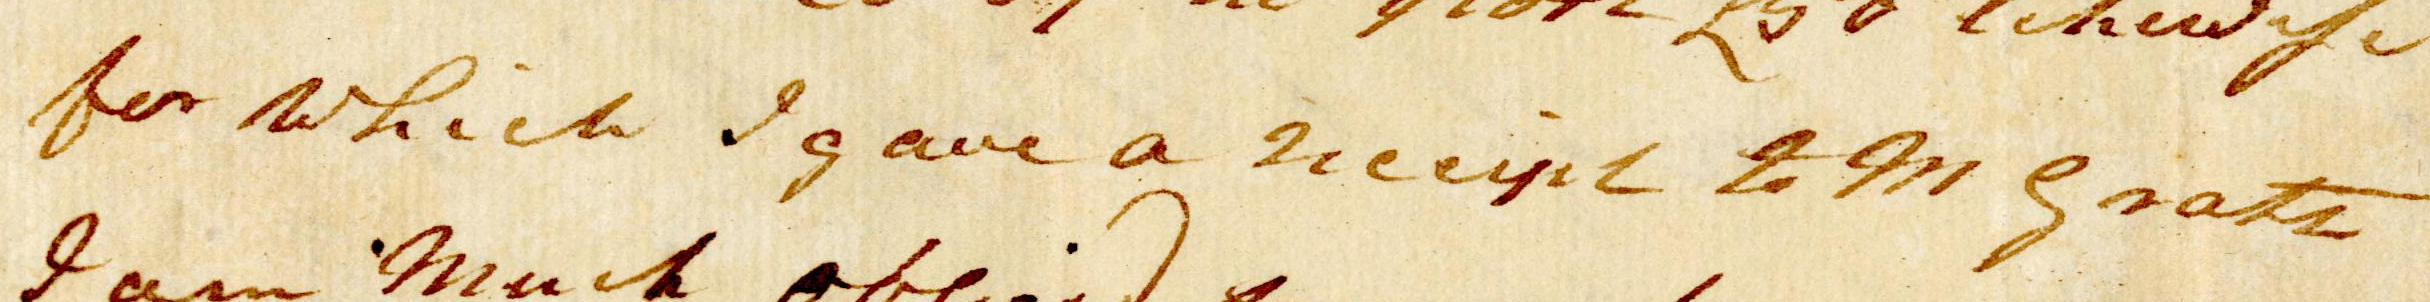fer which I gave a receipt to M Gratz
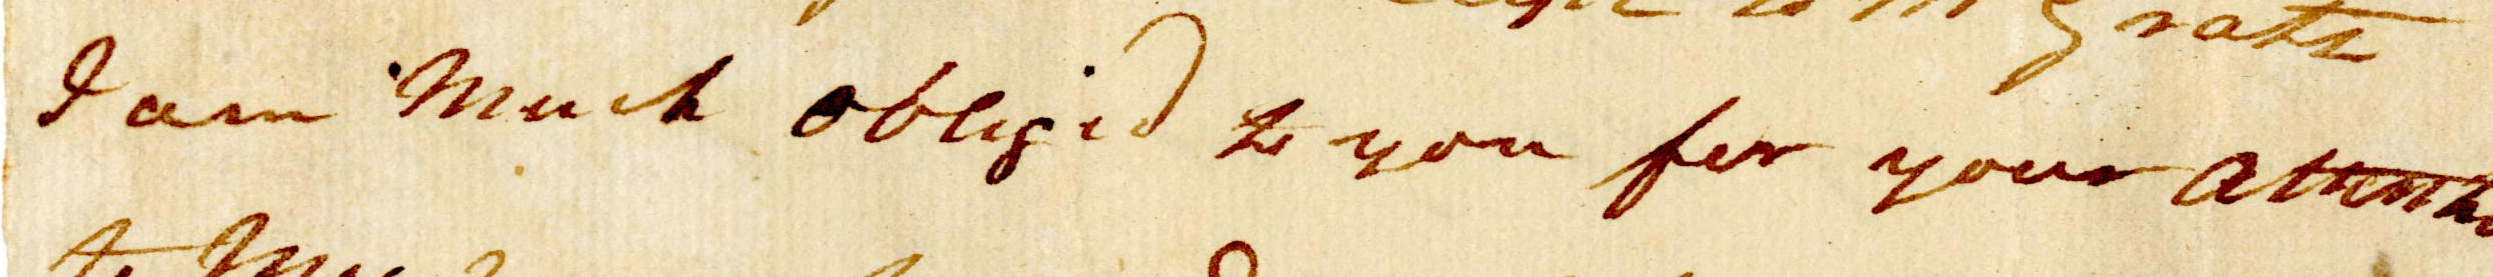I am much obliged & you for your attention
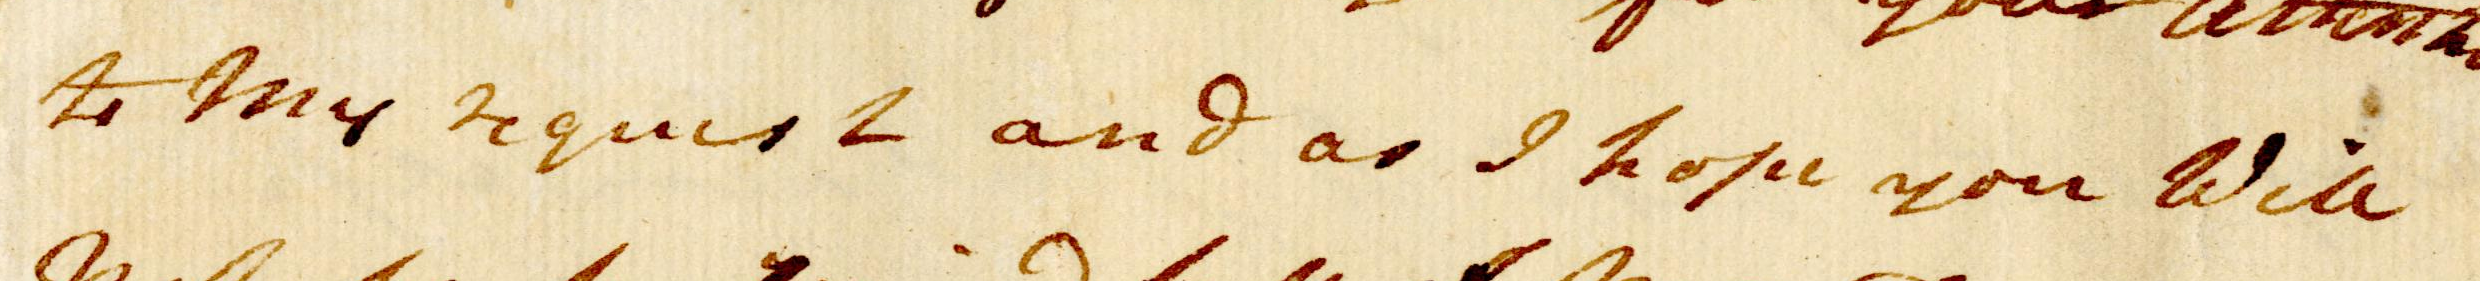to My request and as I hope you Will
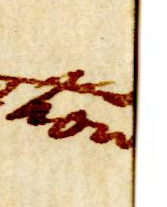ton
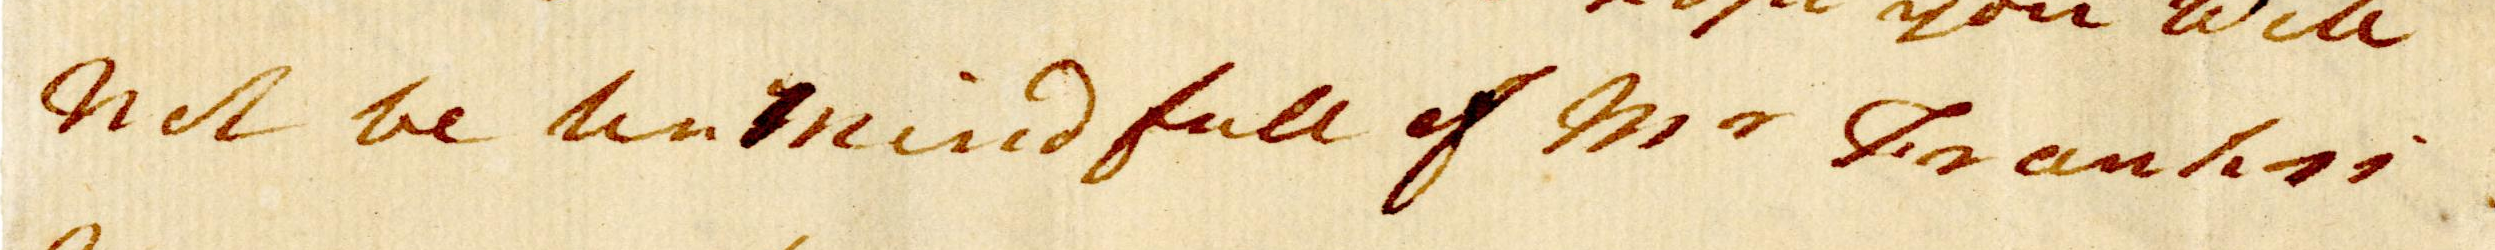not be unmindfull of M^r Franks
